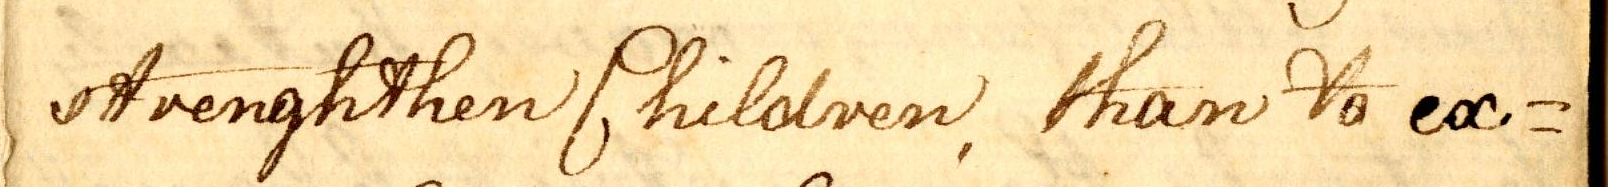strenghthen Children, than to ex-
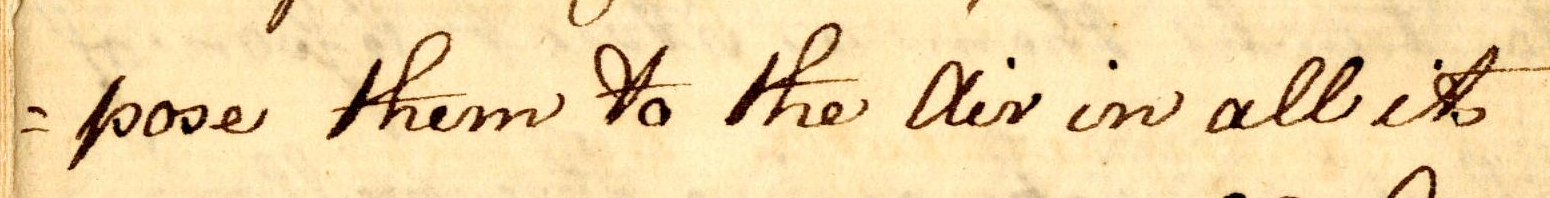-pose them to the Air in all its
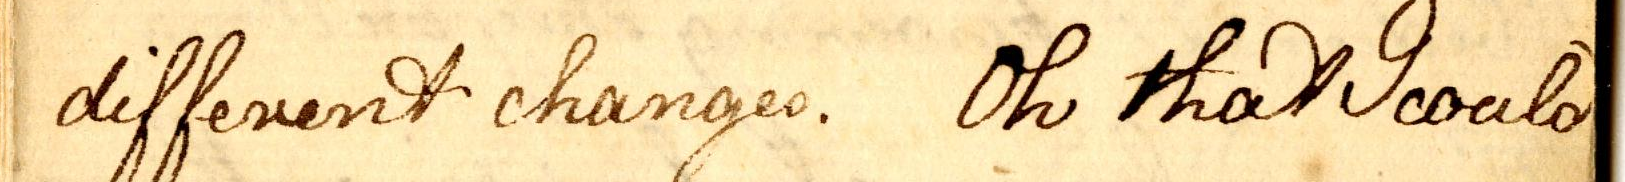different changes. Oh that I could
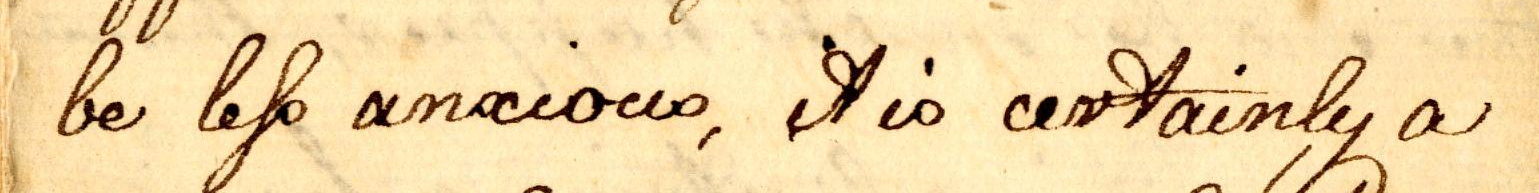be less anxious, it is certainly a
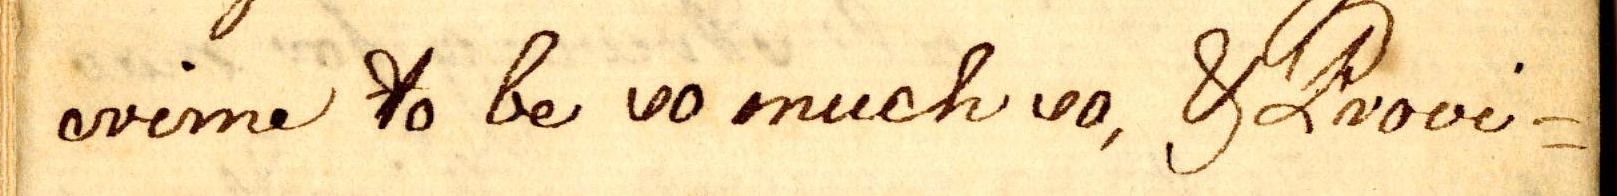crime to be so much so, & Provi-
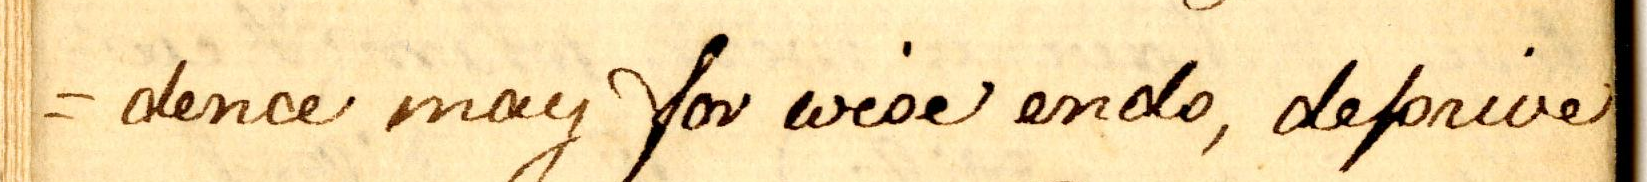-dence may for wise ends, deprive
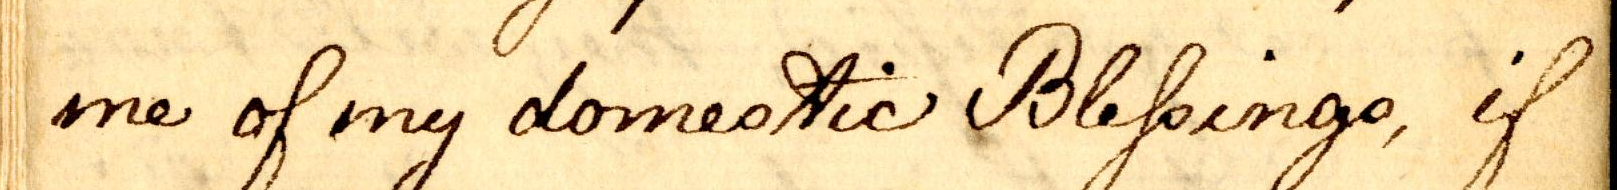me of my domestic Blessings, if
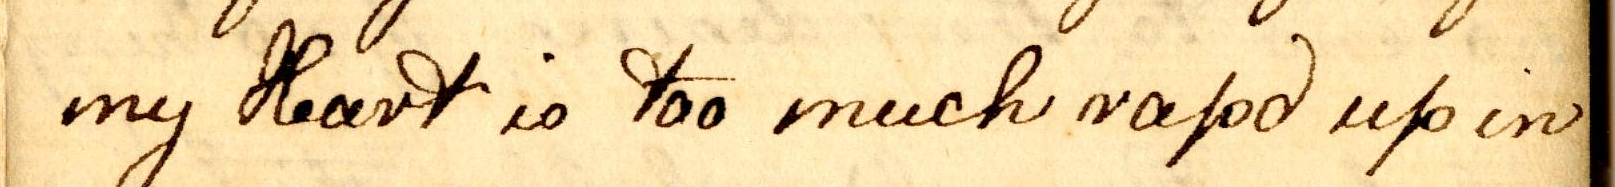my Heart is too much rapd up in
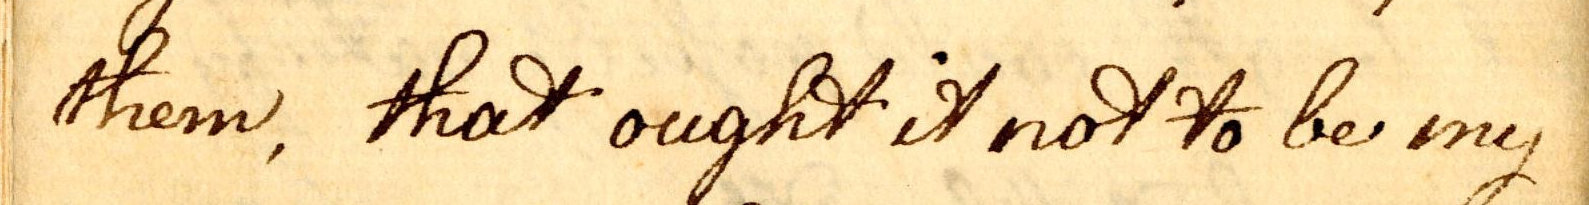them, that ought it not to be my
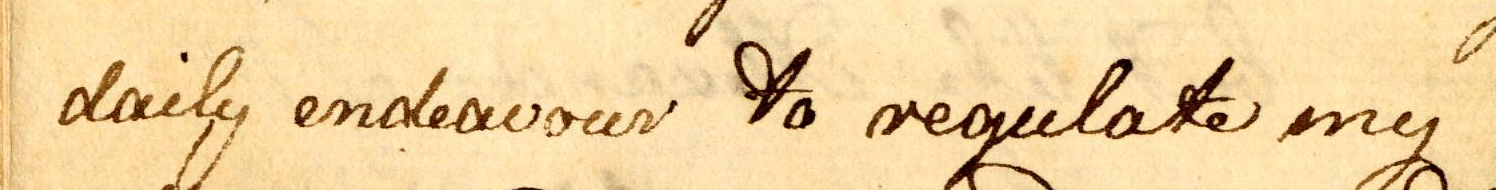daily endeavour to regulate my
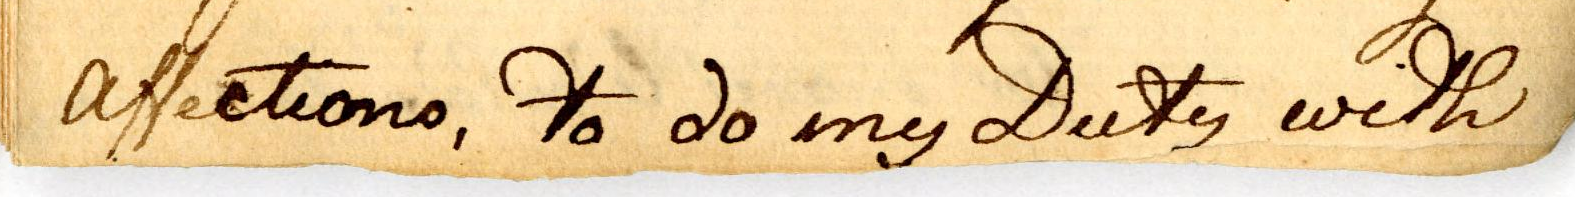Affections, to do my Duty with
